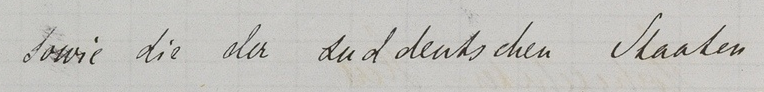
sowie die der süddeutschen Staaten
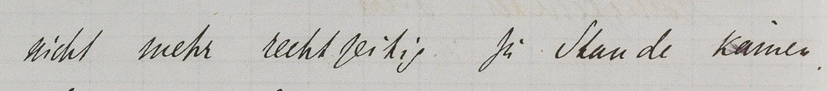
nicht mehr rechtzeitig zu Stande kämen.
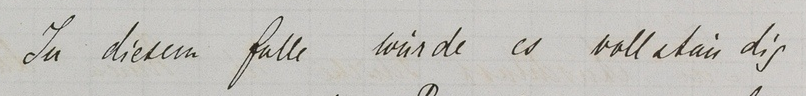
In diesem Falle würde es vollständig
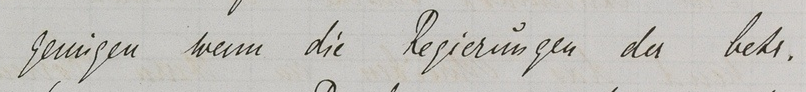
genügen wenn die Regierungen der betr.
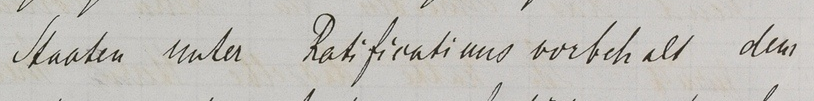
Staaten unter Ratificationsvorbehalt dem
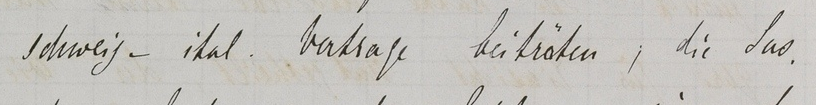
schweiz-ital. Vertrage beiträten; die Sus-
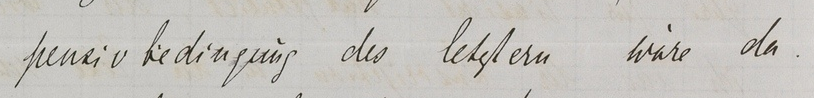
pensivbedingung des letztern wäre da-
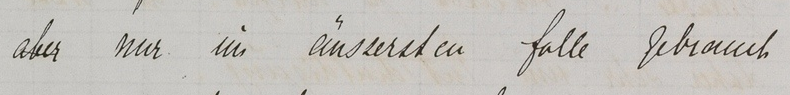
aber nur im äussersten Falle Gebrauch
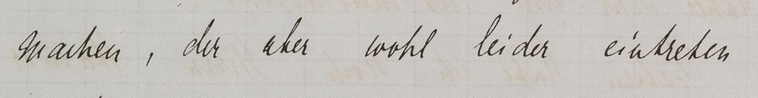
machen, der eher wohl leider eintreten
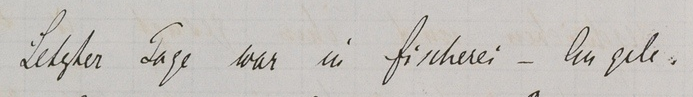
Letzter Tage war in Fischerei-Angele-
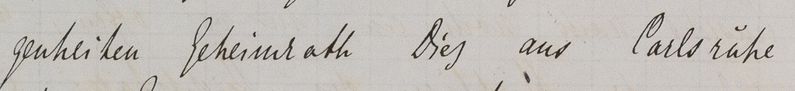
genheiten Geheimrath Diez aus Carlsruhe
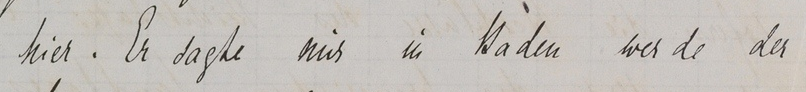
hier. Er sagte mir in Baden werde der
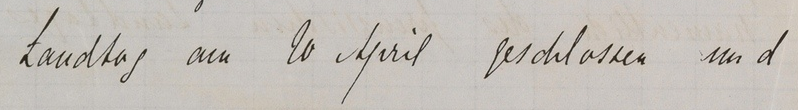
Landtag am 20 April geschlossen und
